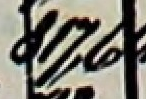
817,6
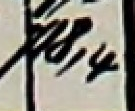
718,4
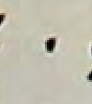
,
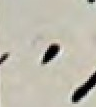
,
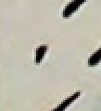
,
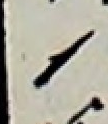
1
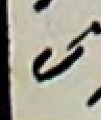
5
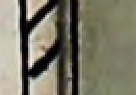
1?
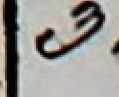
3
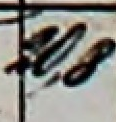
20,8
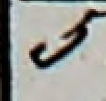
5
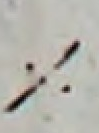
./.
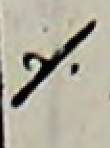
./.
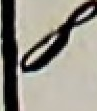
8
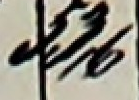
53,6
